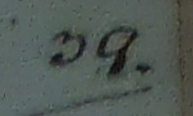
39.
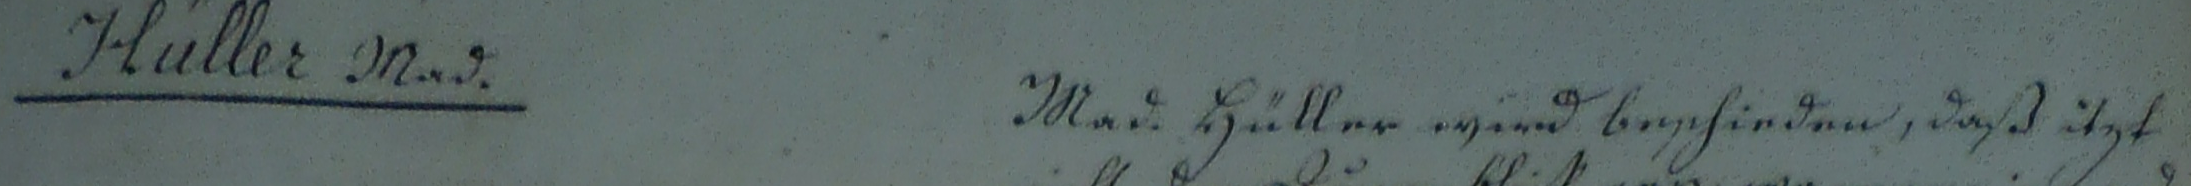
Hüller Mad. Mad. Hüller wird beschieden, daß itzt
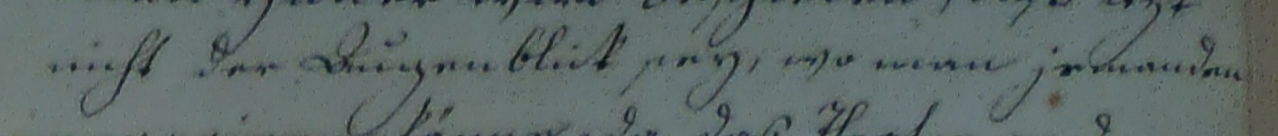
nicht der Augenblick sey, wo man jemanden
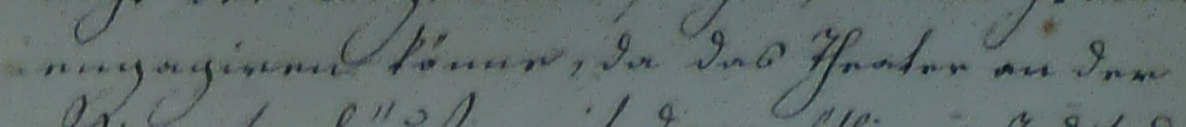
engagiren könne, da das Theater an der
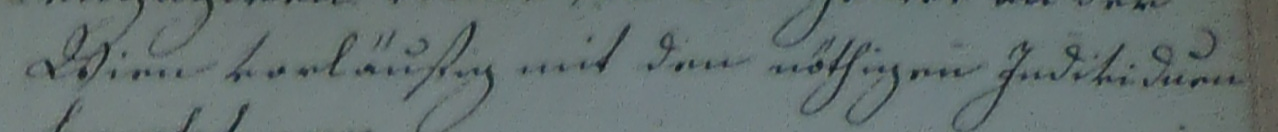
Wien vorläufig mit den nöthigen Individuen
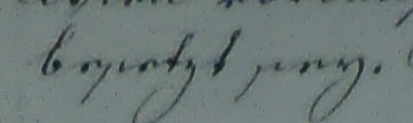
besetzt sey.
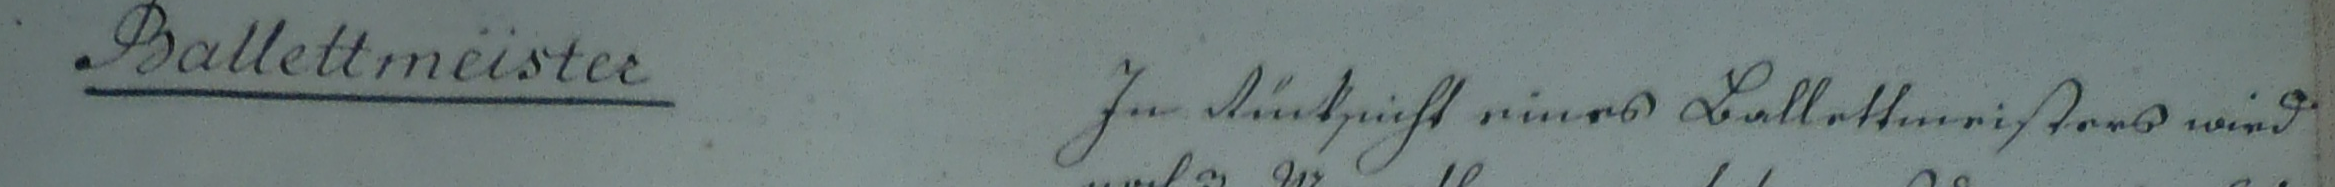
Ballettmeister In Rücksicht eines Ballttmeisters wird
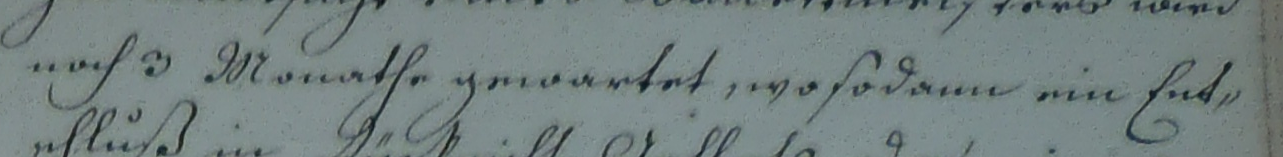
noch 3 Monathe gewartet, wo sodann ein Ent¬
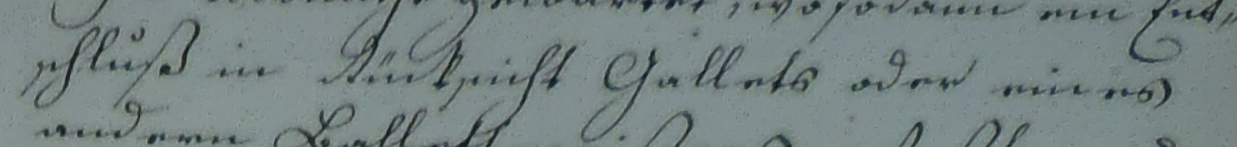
schluß in Rücksicht Gallets oder eines
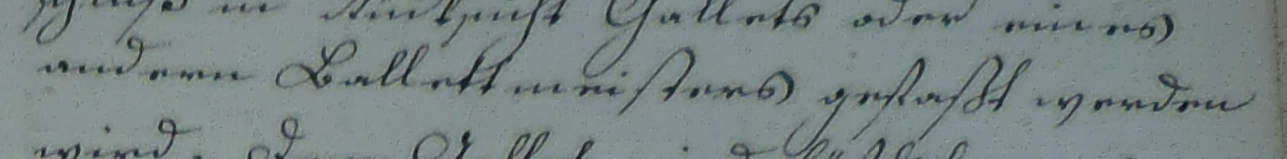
andern Ballettmeisters gefaßt werden
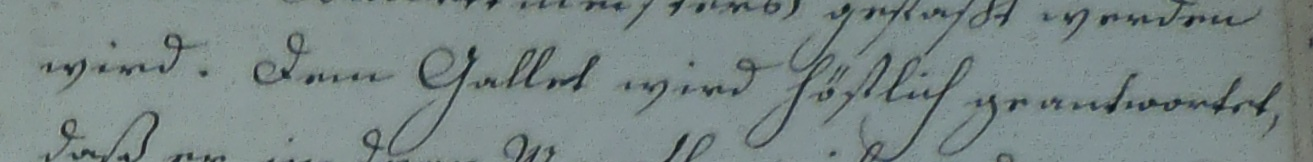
wird. Dem Gallet wird höflich geantwortet,
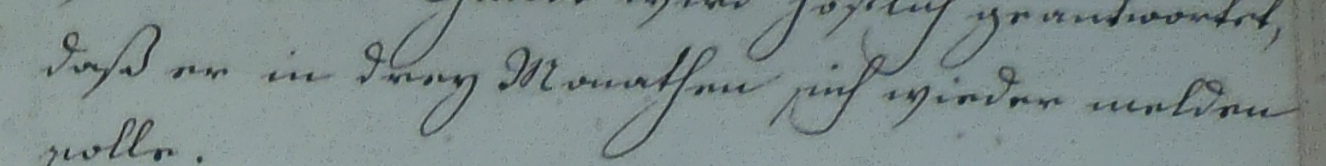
daß er in drey Monathen sich wieder melden
